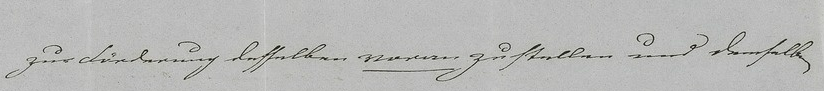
zur Förderung desselben voran zu stellen und demselben
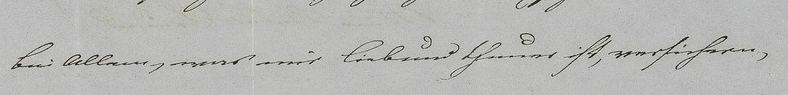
bei Allem, was mir lieb und theuer ist, versichern,
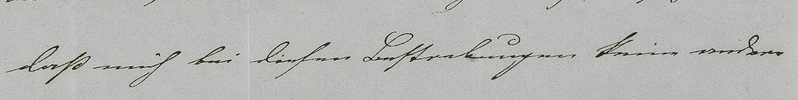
daß mich bei diesen Bestrebungen keine andere
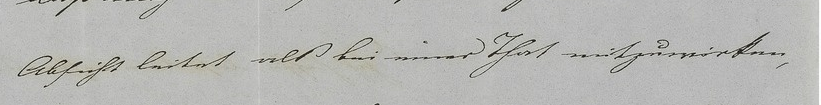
Absicht leitet als bei einer That mitzuwirken,
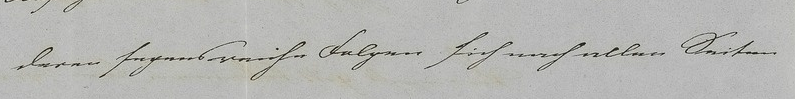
deren segensreiche Folgen sich nach allen Seiten
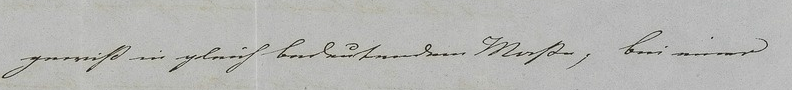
gewiß in gleich bedeutendem Maße; bei einer
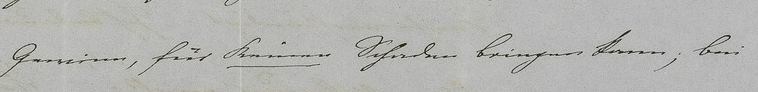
Gewinn, für Keinen Schaden bringen kann; bei
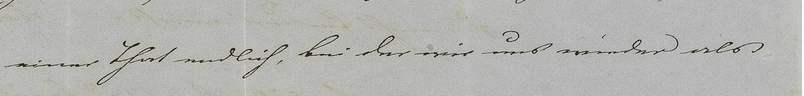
einer That endlich, bei der wir uns wieder als
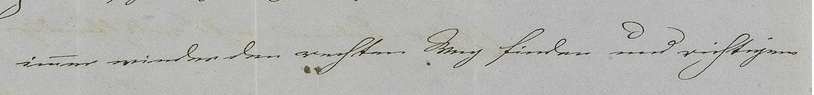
immer wieder den rechten Weg finden und richtigem
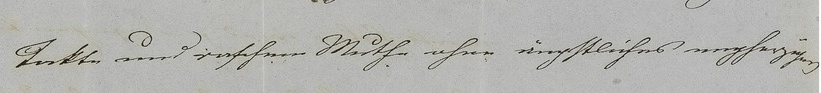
Takte und raschem Muthe ohne ängstliches engherziges
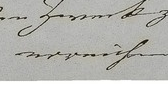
erreichen.
